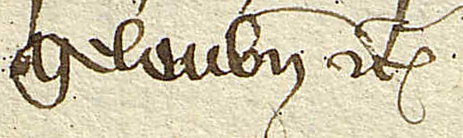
gelaubn* ec*
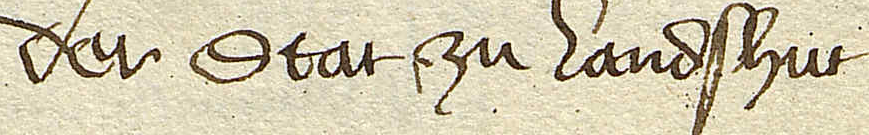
Der Stat cʒu landſhut
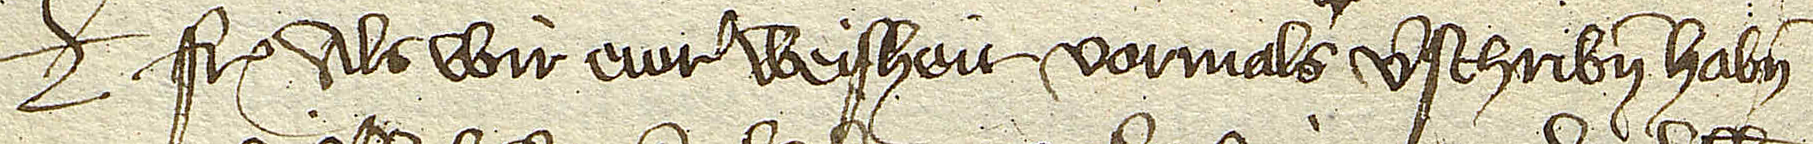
L* fr* Als wir ewr* weiſheit vormals v*ſchribn* habn*
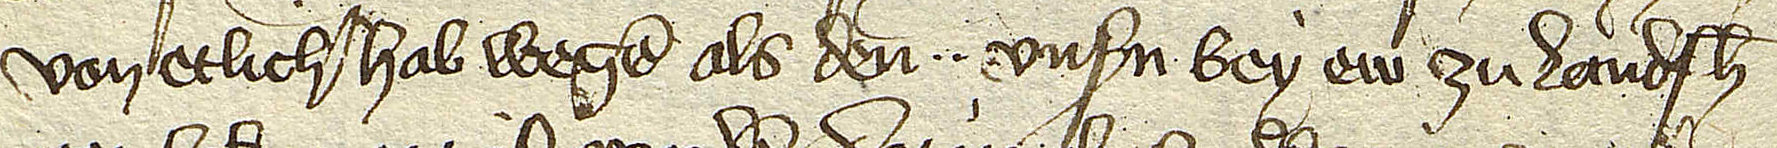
von etlich* hab wege* als den ~ vnſ*n bey ew cʒu landſh*
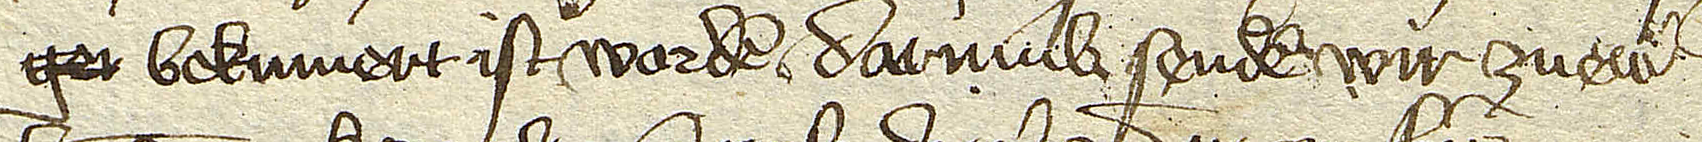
ger bekumert iſt worde* / darümb ſende* wir cʒu ew*
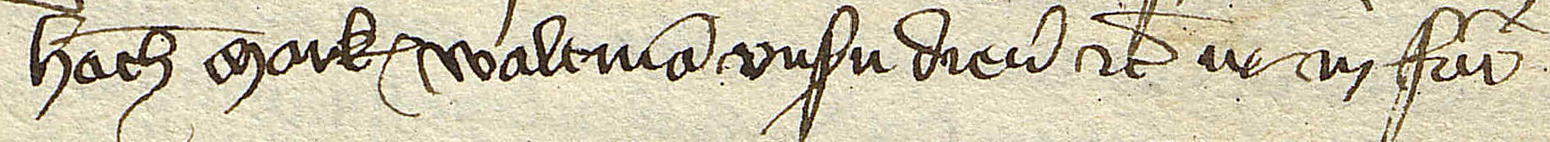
hoch* Mark* waltma* vnſ*n dien* ec* ut in for*
